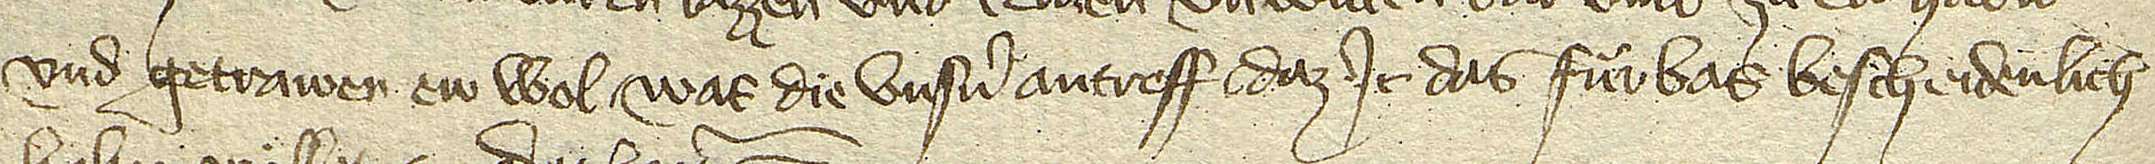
vnd getrawen ew wol was die vnſn* antreff / daʒ Ir das fürbas beſcheidenlich
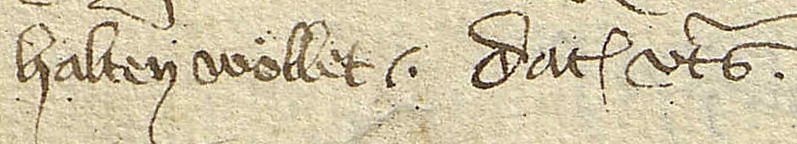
haben wöllet / . Dat* vts* .
